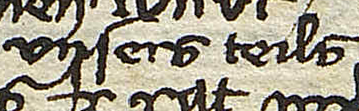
vnſers teils
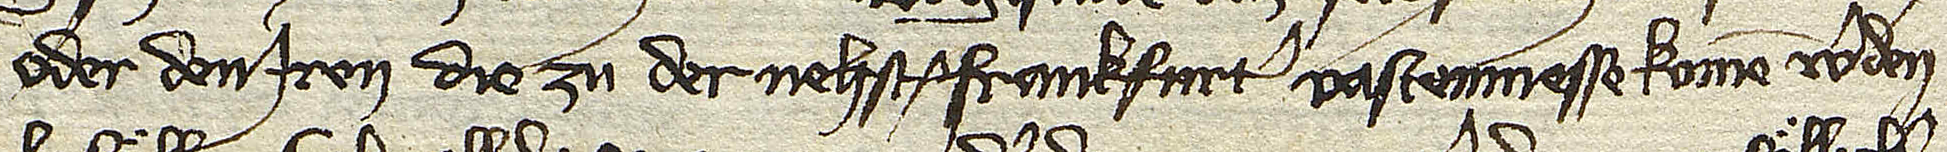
oder den Iren die ʒu der nehſt* frankfurt* vaſtenmeſſe kome* w*den
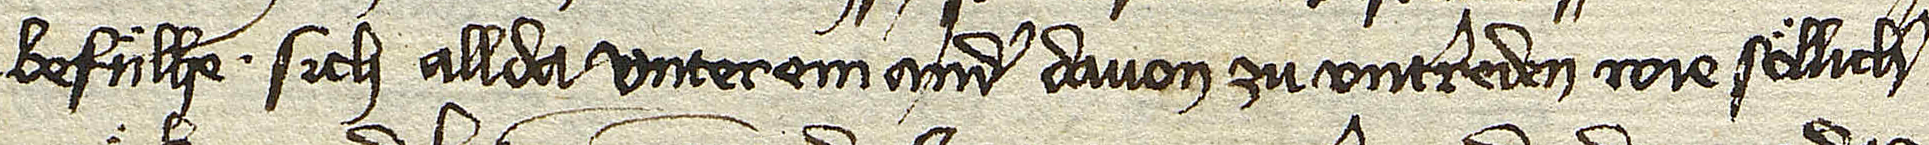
befülhe . ſich allda vnterein and* dauon ʒu vntr*eden wie ſöllich*
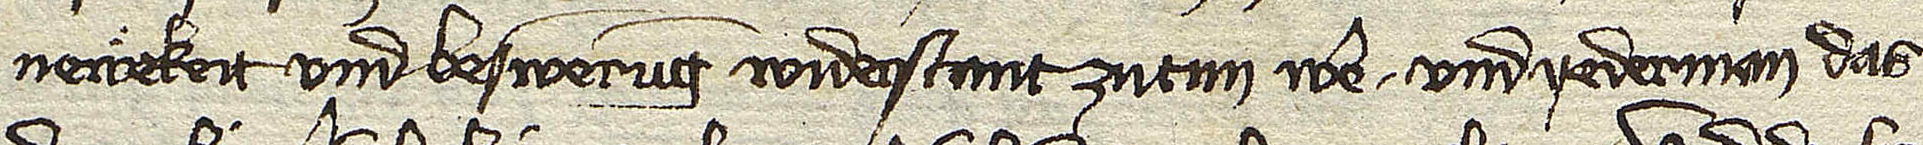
newekeit vnd beſwerug* widerſtant ʒutun we* . vnd yederman das
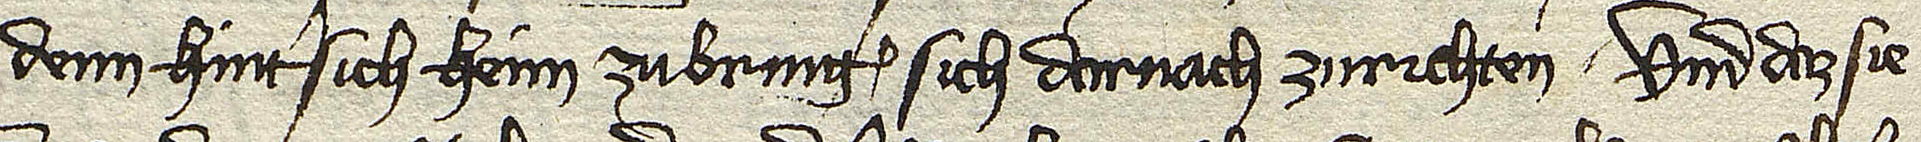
denn hint* ſich heim ʒubring* ſich darnach ʒurichten / Vnd daʒ ſie
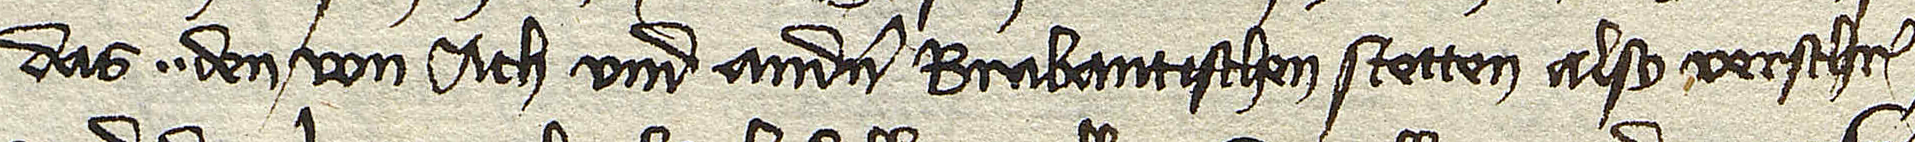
das ~ den von Ach vnd andn* Brabantiſchen ſtetten alſo verſchr*
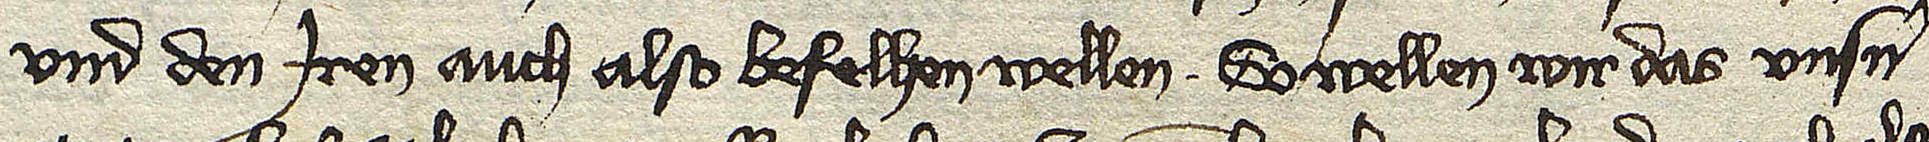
vnd den Iren auch alſo befelhen wellen . So wellen wir das vnſn*
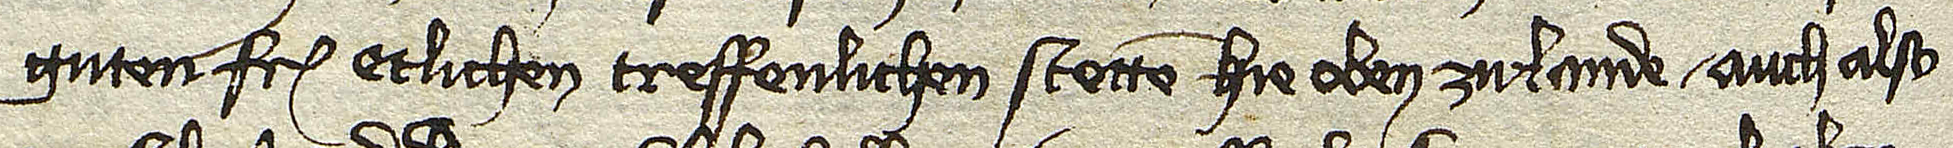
guten fr* etlichen treffenlichen ſtette* hie oben ʒulande / auch alſo
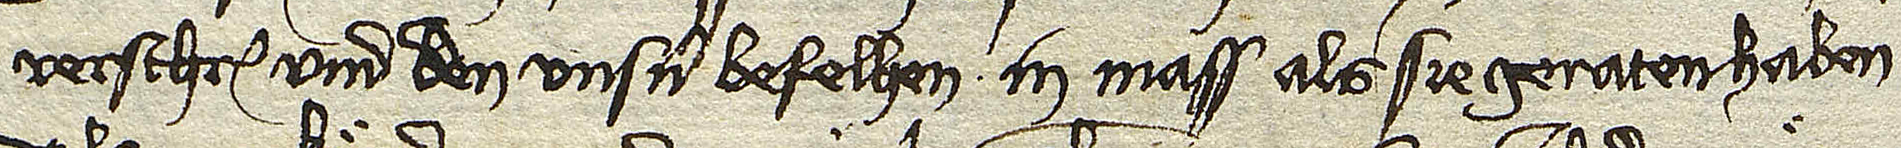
verſchr* vnd den vnſn* befelhen . in maſſ als ſie geraten haben
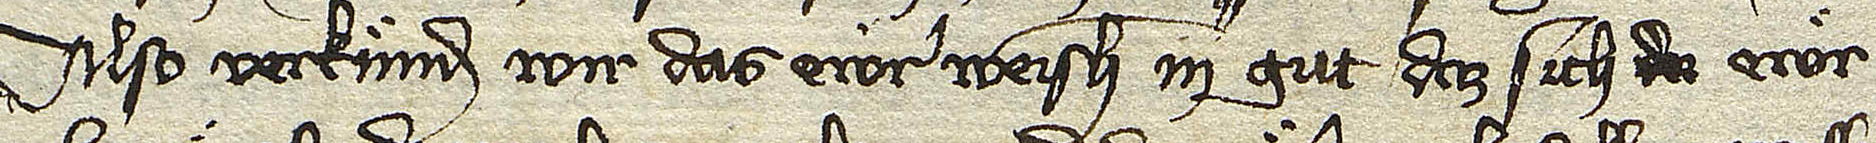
Alſo verkünd* wir das ewr* weiſh* in gut daʒ ſich die ewr
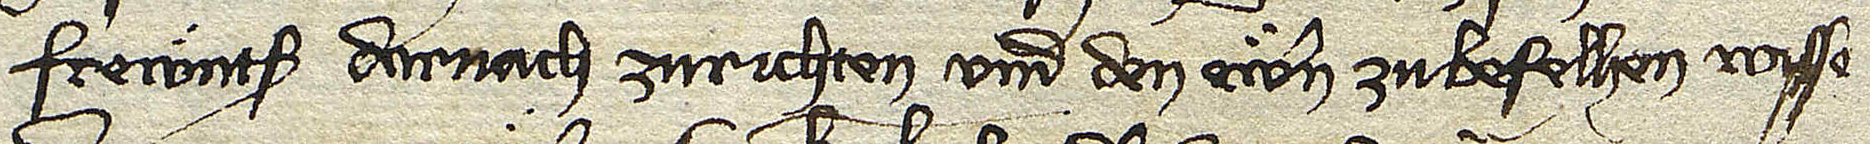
frewntſ* darnach ʒurichten vnd den ew*n ʒubefelhen wiſſe
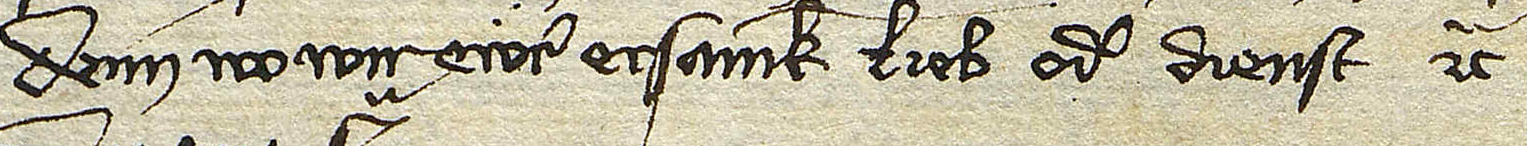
Denn wo wir ewr* erſamk* Lieb od* dienſt ec*
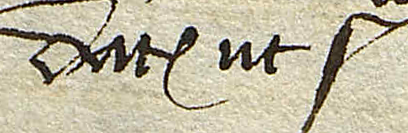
Dat* ut ſ*
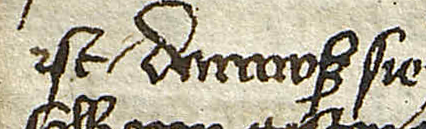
iſt / darawſʒ ſie In
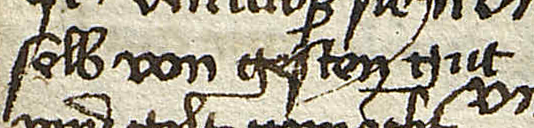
ſelb von geſten gut
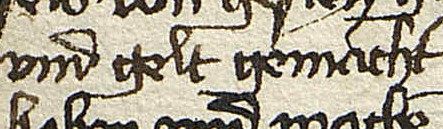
vnd gelt gemacht
